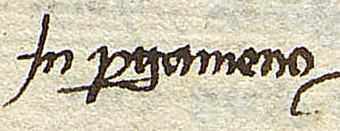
In p*gameno
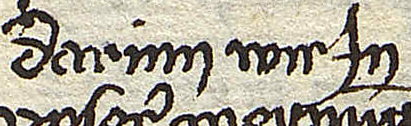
darinn wir In
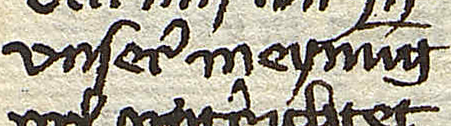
vnſer* meynu*g
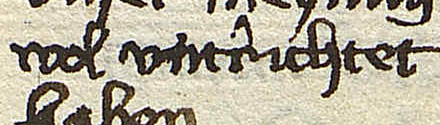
wol vnt*richtet
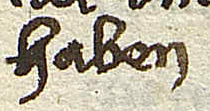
haben
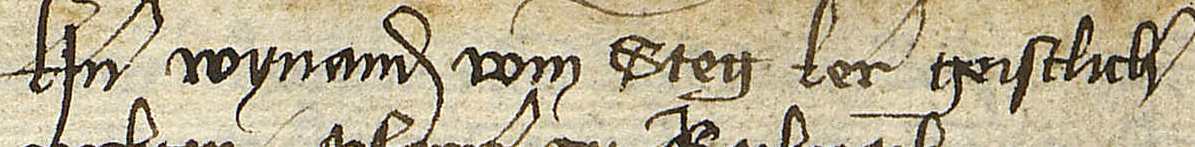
H*n wynand* vom* Steg Ler* geiſtlich*
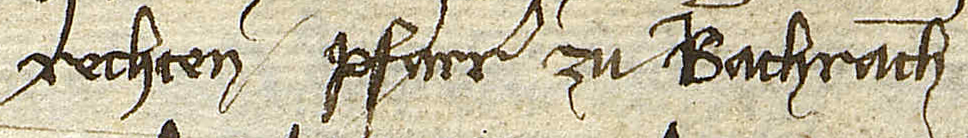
rechten pfarr* ʒu Bachrach
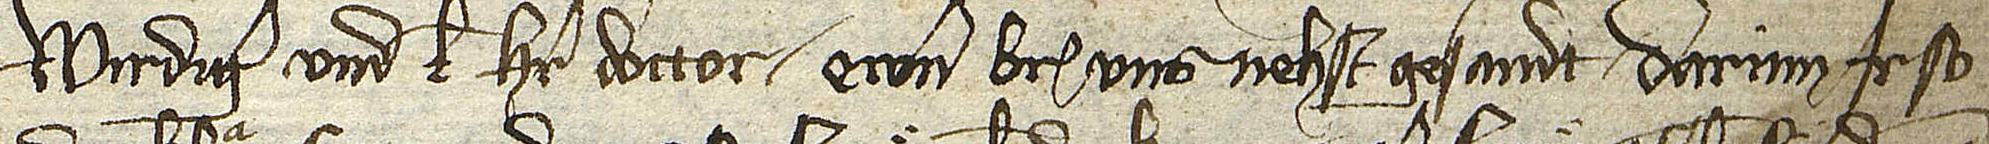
Wirdig* vnd l* h*r doctor / ew*n br* vns nehſt geſandt / Darinn Ir ſo
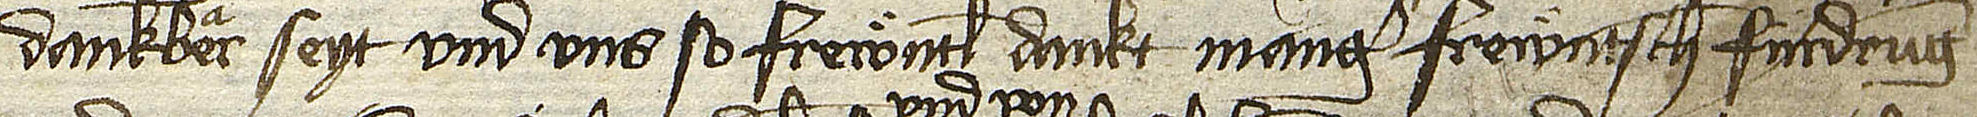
dankbër ſeyt vnd vns ſo frewntl* dankt mang* frewntſch* fürdru*g
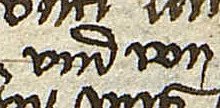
vnd von
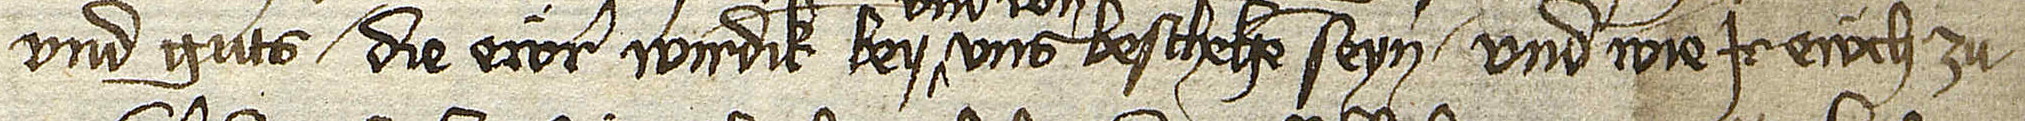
vnd guts / die ew*r wirdik* bey vns beſchehe* ſeyn / vnd wie Ir ewch ʒu
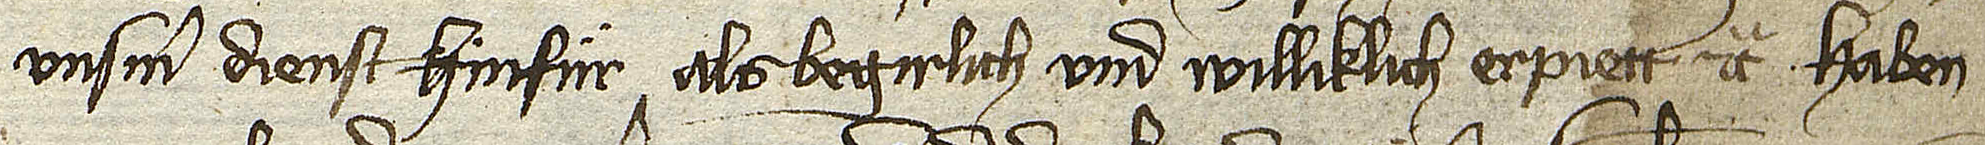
vnſ*m dienſt hinfür als begirlich vnd williklich erpiett ec* . Haben
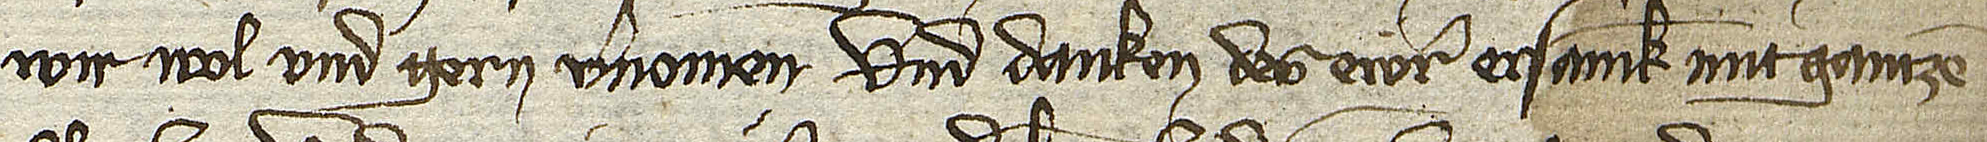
wir wol vnd gern v*nomen . Vnd danken des ew*r erſamk* mit gancʒe*
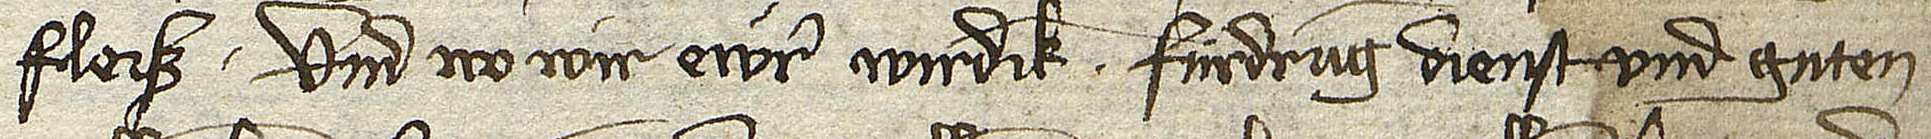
fleiſʒ / Vnd wo wir ew*r wirdik* . fürdru*g dienſt vnd guten
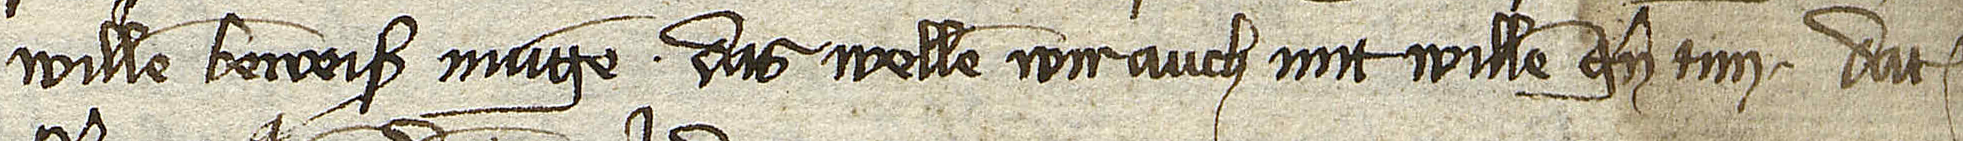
wille* beweiſ* muge* . das welle* wir auch mit wille* g*n tun . dat*
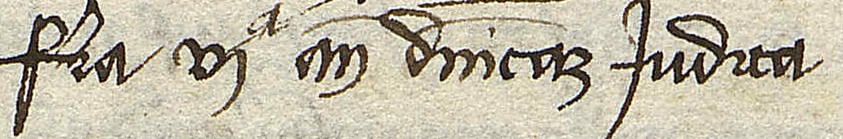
fia* vi* an* dnica* Iudica
